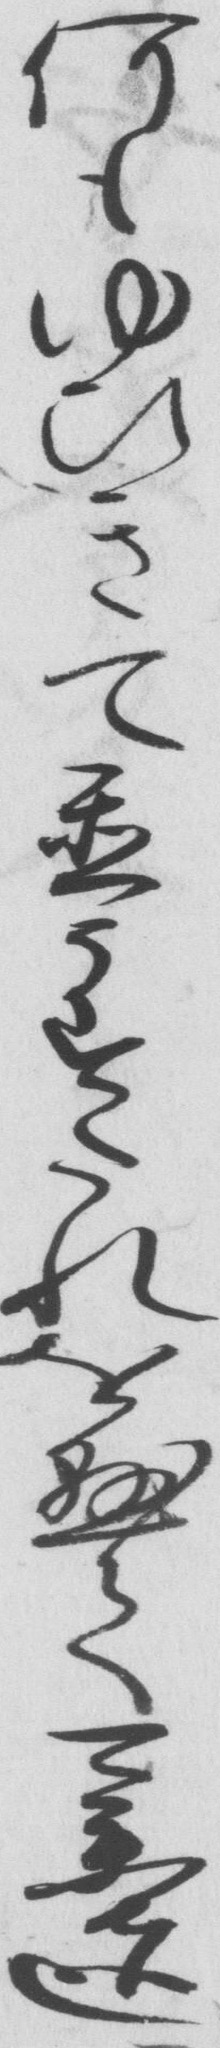何もゆひきて置うすたれを懸て可参者也
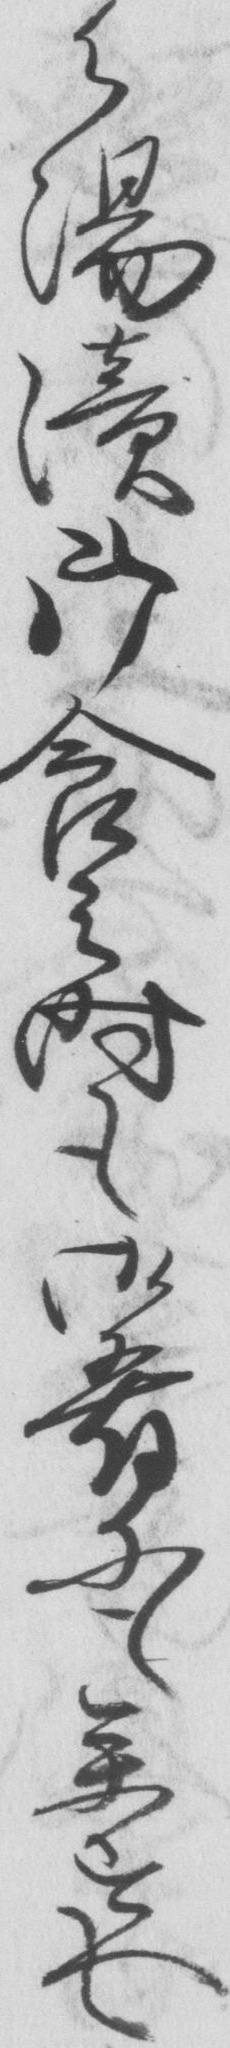て湯漬御食之時も御肴にも参すへし
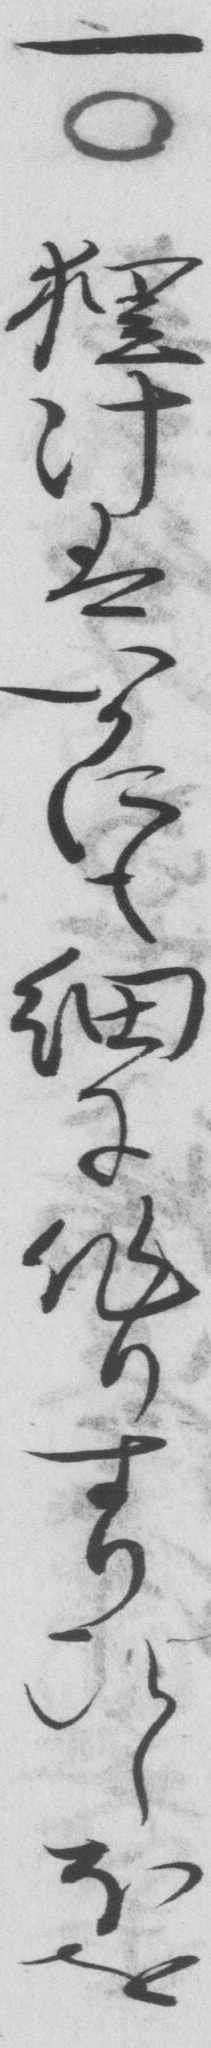一○狸汁はいかにも細に作りすりひしほを
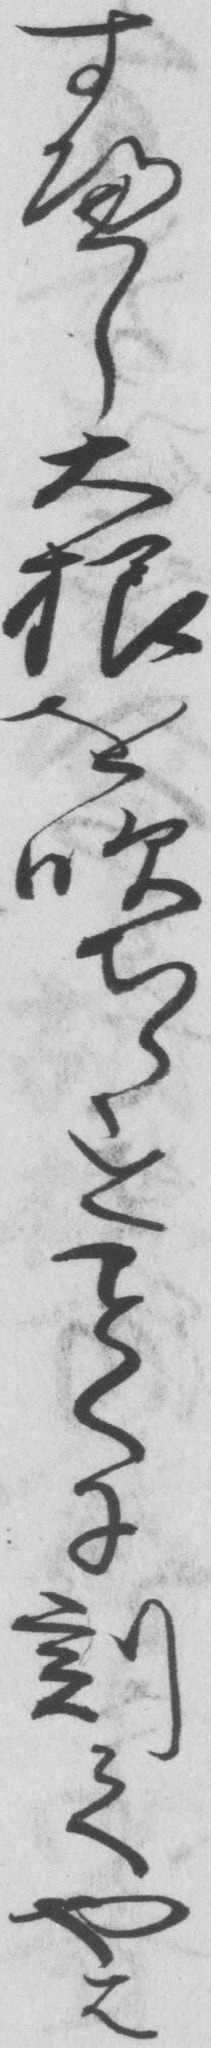すへし大根を吹ちらすことくに割てやは
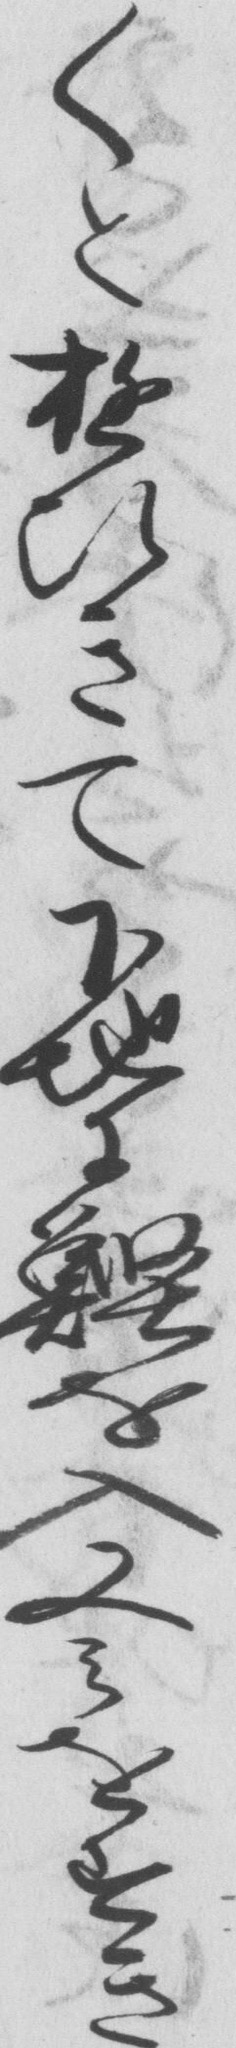〳〵とゆひきて下地に鰹を入又みをすき
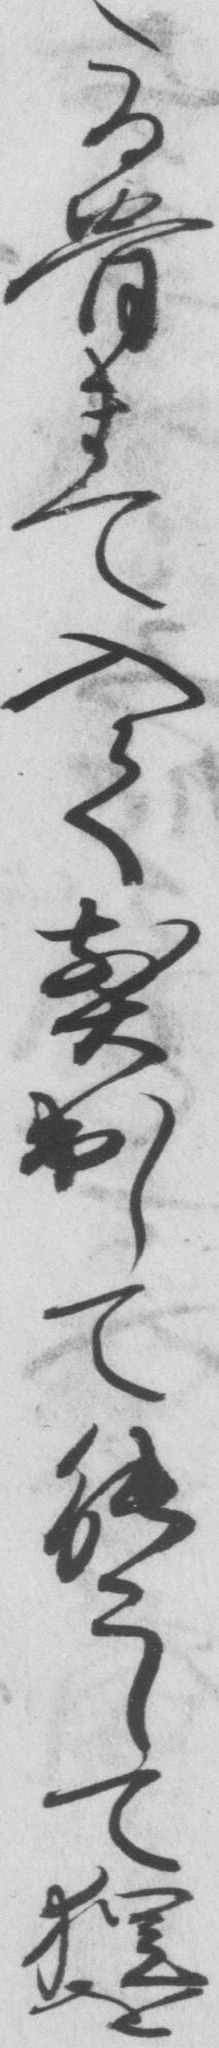たる骨まて入て煎出して能こして狸を
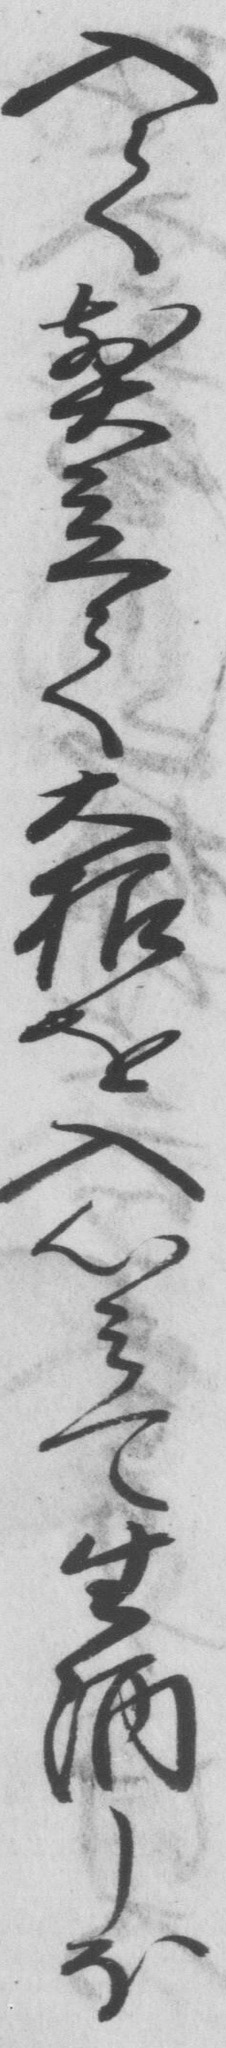入て煎立て大根を入心みて生酒しほ

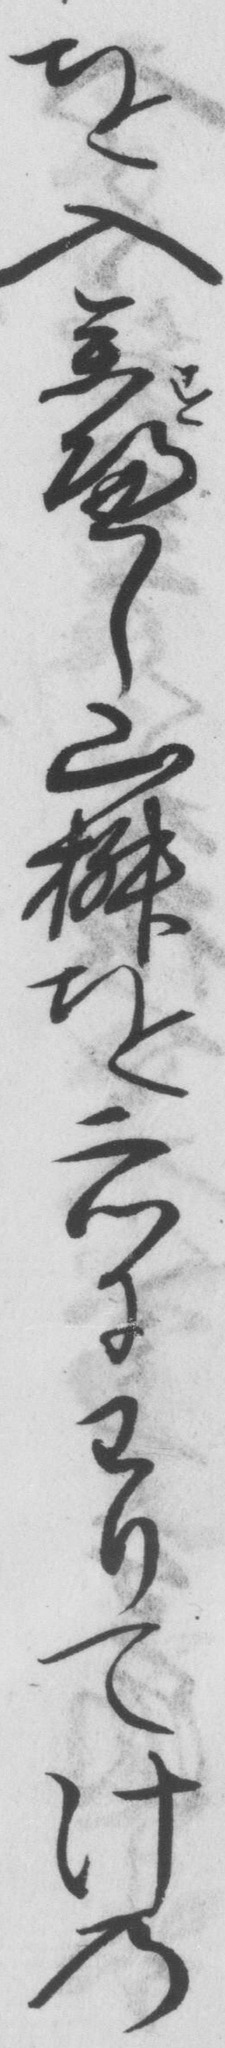を入参すへし山椒を二ツにわりて汁の
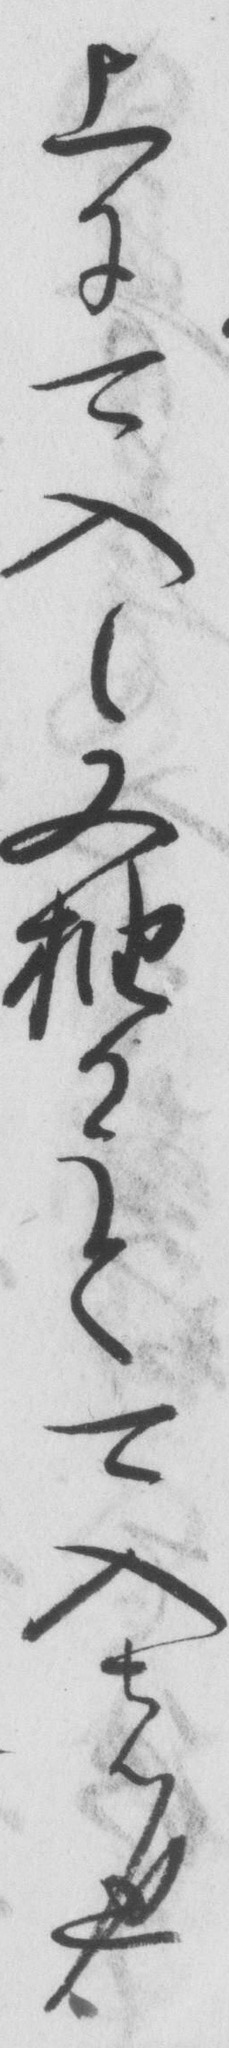上に可入候又柚かうと可入者也
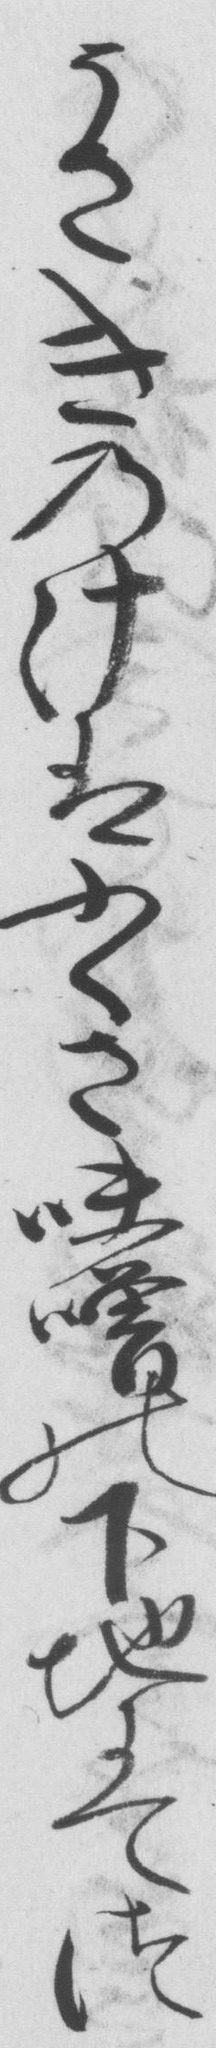一○うさきの汁はふき味噌の下地にてつ
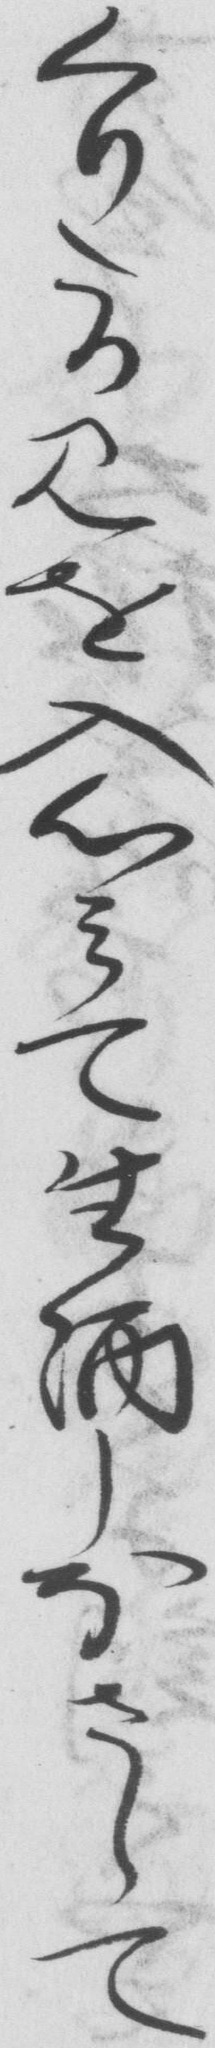くりたるみを入心みて生酒しほさして
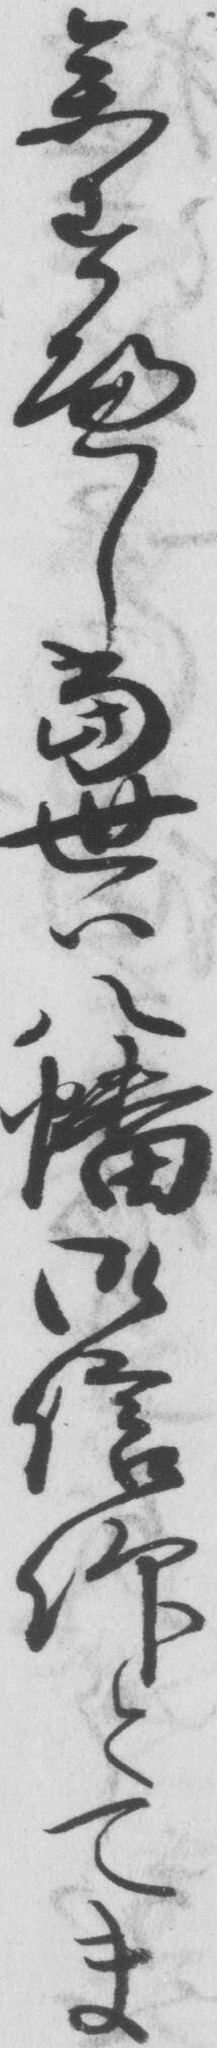参すへし当世は八幡御信仰とてま
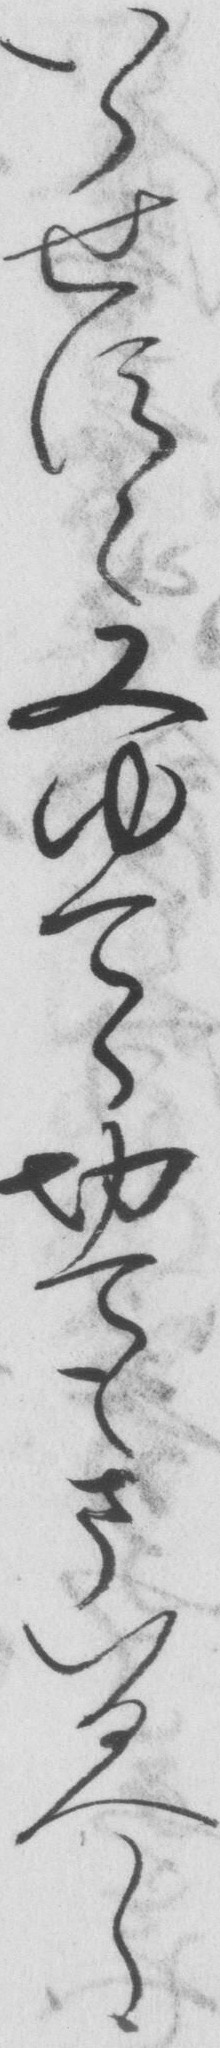いらせす候又ゆてゝ切てもまいるへし
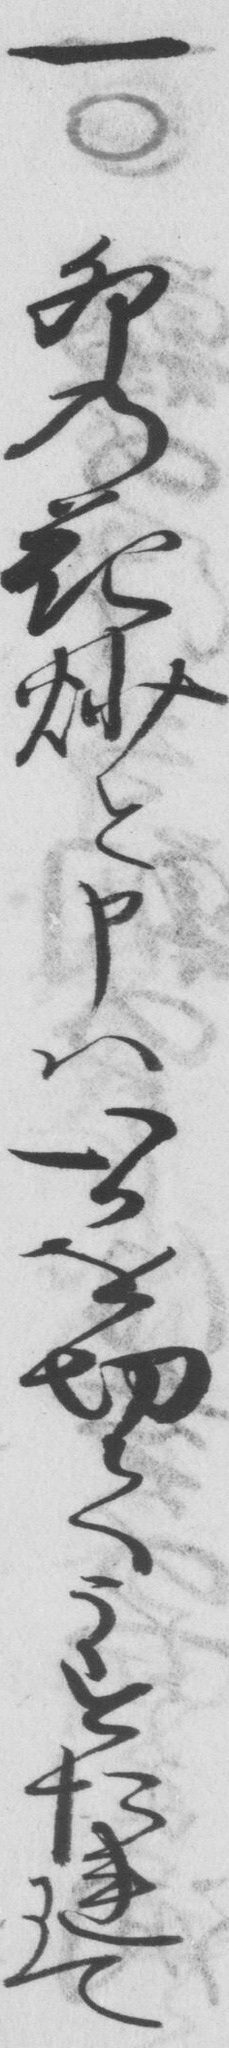一○卯の花炒と申はいかを切てうすたれにて
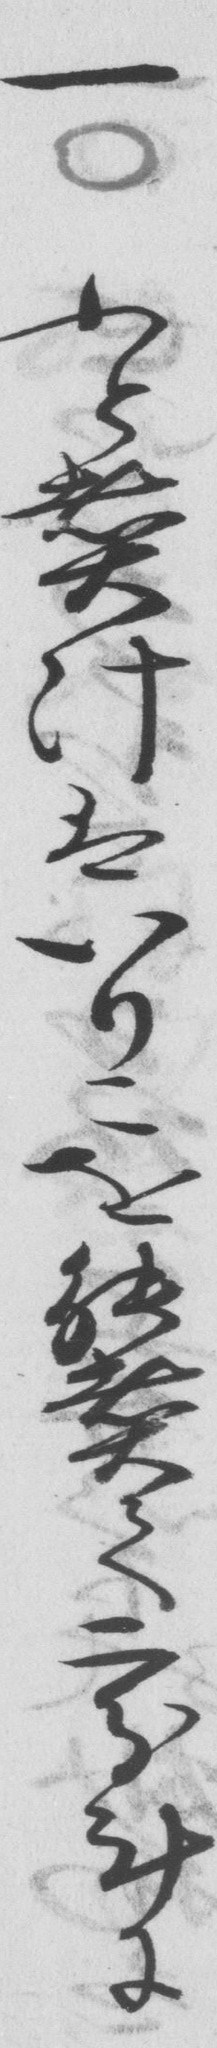一○ふと煮汁はいりこを能煮て二分斗に
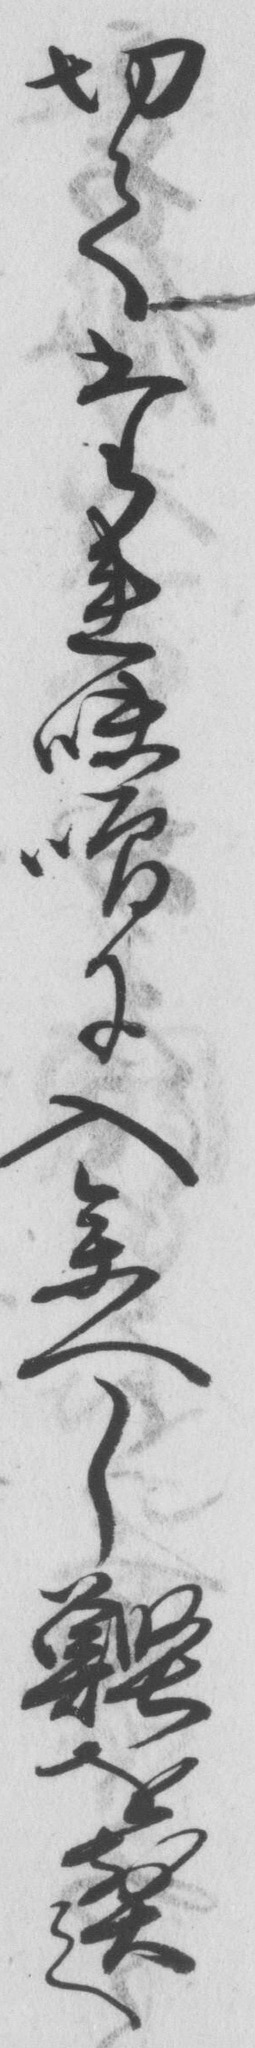切てたれ味噌に入参へし鰹を煮て
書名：料理次第
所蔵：大阪府立大学学術情報センター 国文学研究資料館
